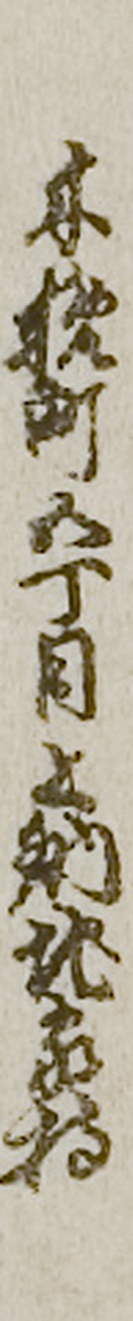木挽町五丁目上納地家持
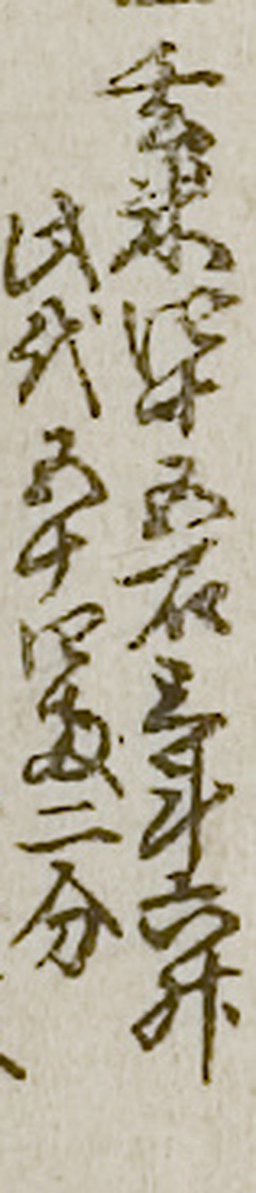此代五十四両二分
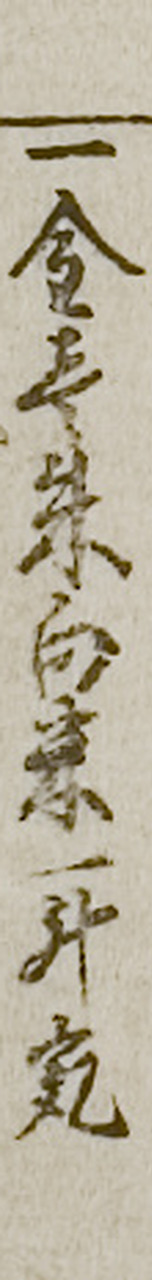一金壱朱白米一升宛
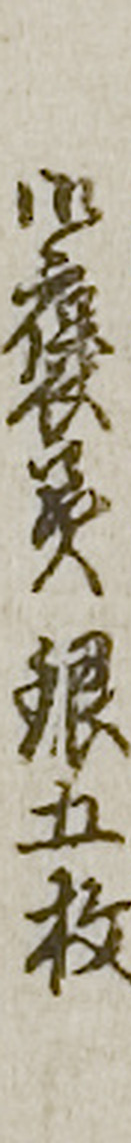御褒美銀五枚
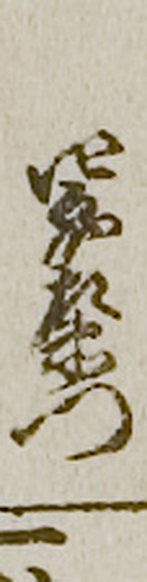四郎左衛門
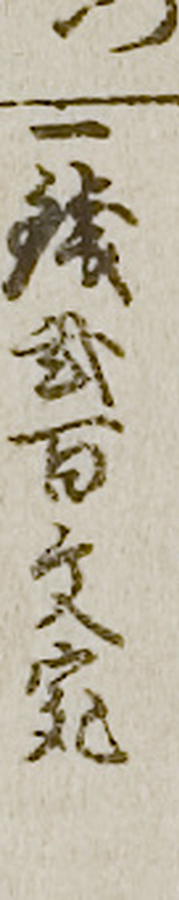一銭弐百文宛某
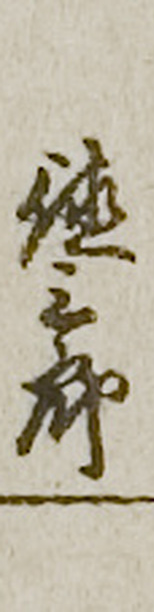喜三郎
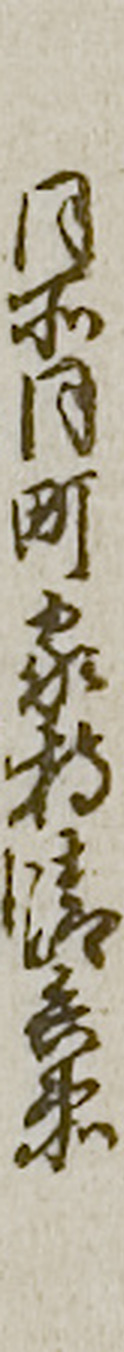同所同町家持清兵衛
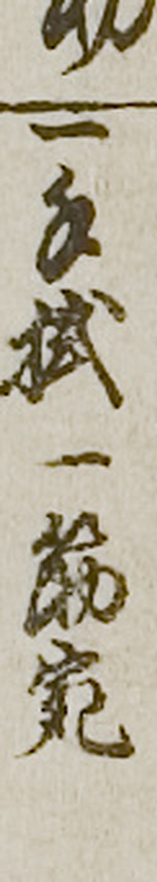一手拭一筋宛
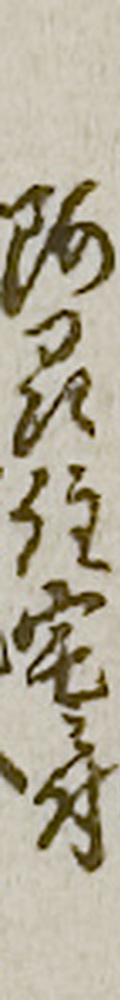阿州住宅に付
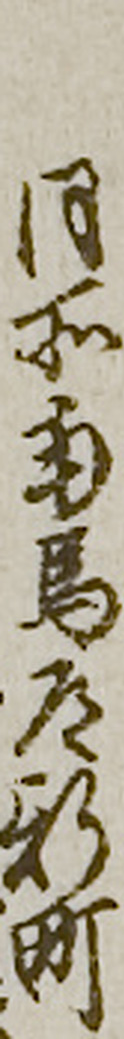同所南馬道新町
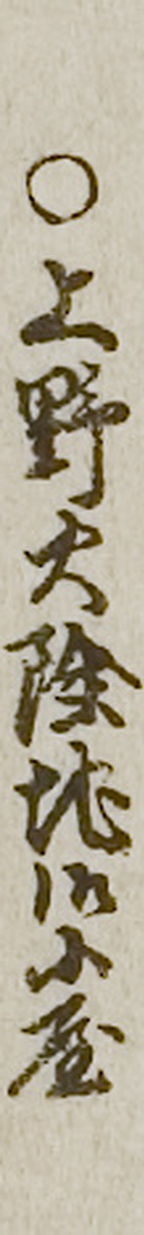○上野火除地御小屋
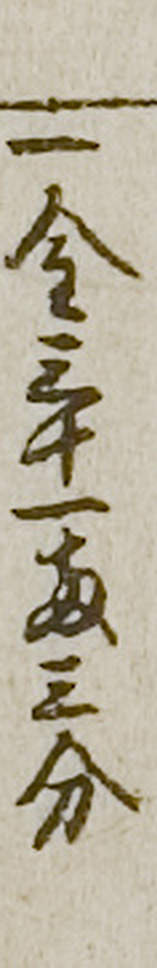一金三十五両弐分
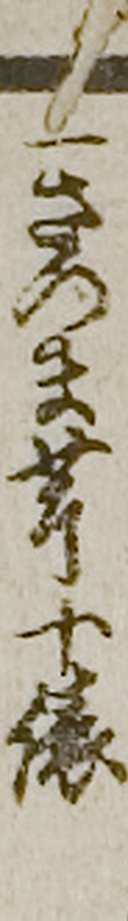一さつま芋十俵
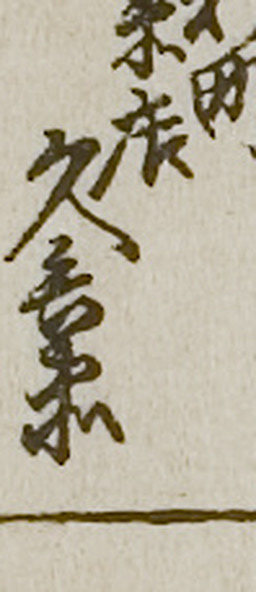平兵衛
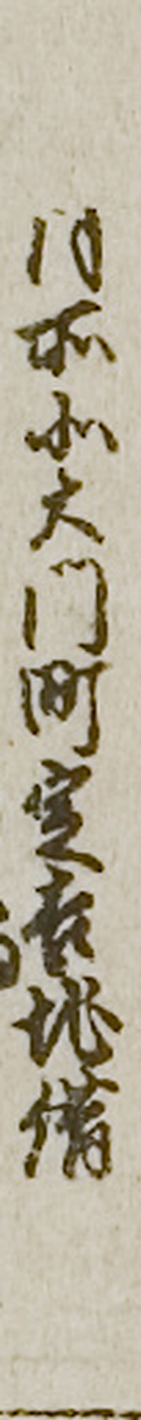同所北大門町定吉地借
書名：地震出火御救小屋施行名前附
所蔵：東京大学総合図書館 General Library in the University of Tokyo, JAPAN
